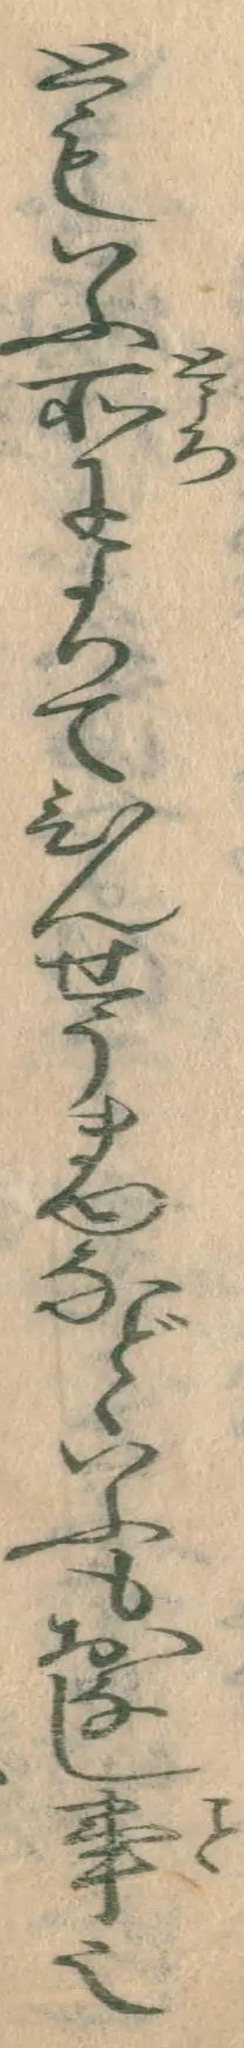ともいふ所によりてひんせうまゆなどゝいふもおなし事也

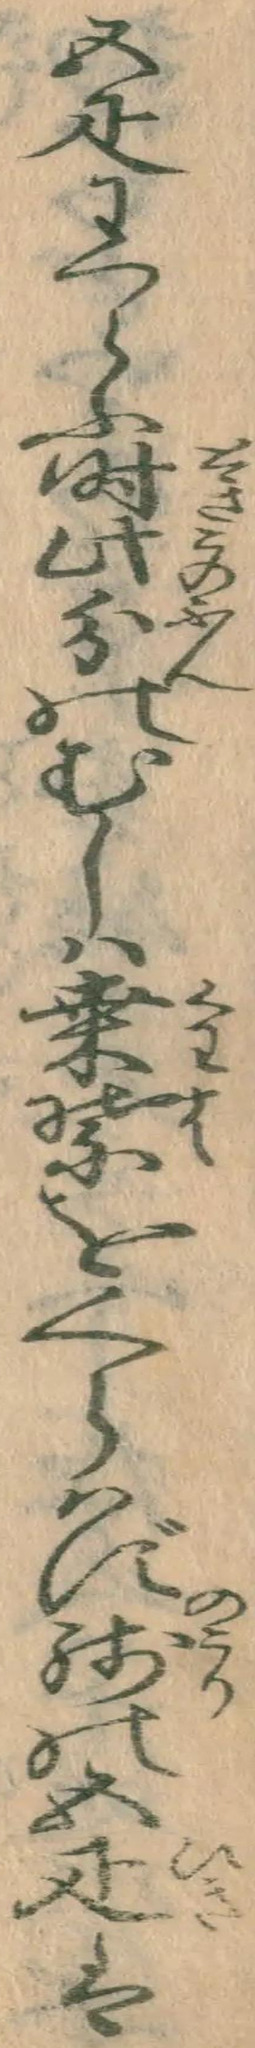五疋につらふ時此分のむしは桑葉をくらはず残の五疋は
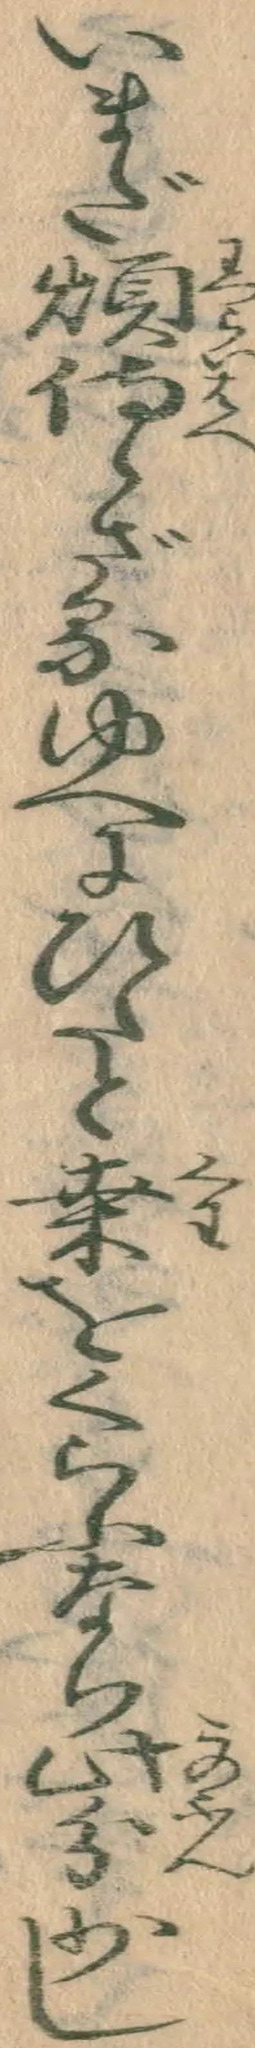いまだ煩侍らざるゆへにひたと桑をくらふなり此分少し
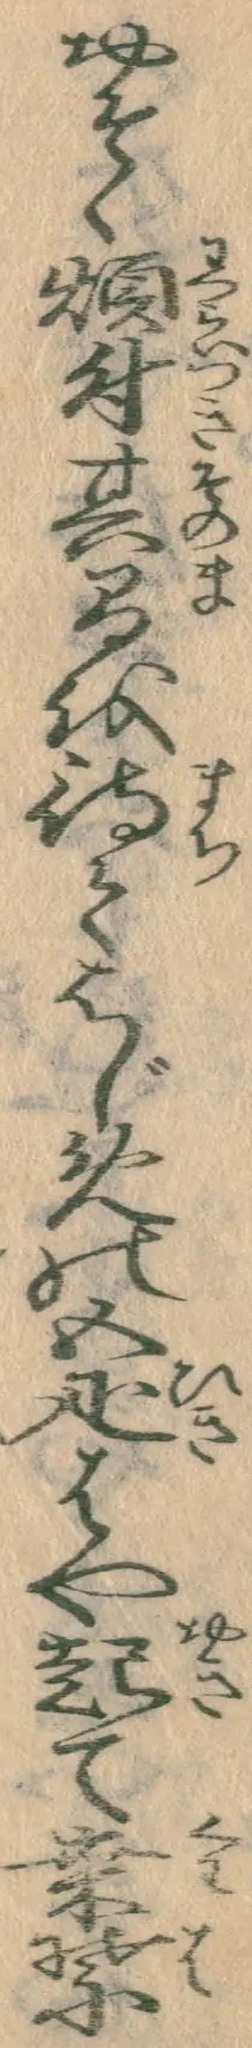おそく煩付其間を待てはじめの五疋はや起て桑葉
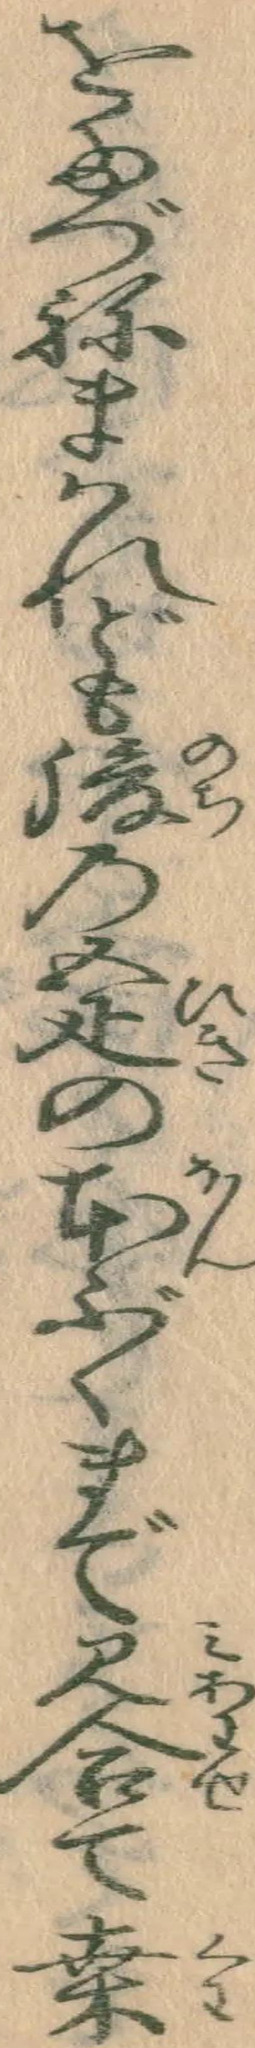をたづねまはれども後の五疋の本ぶくまで見合て桑
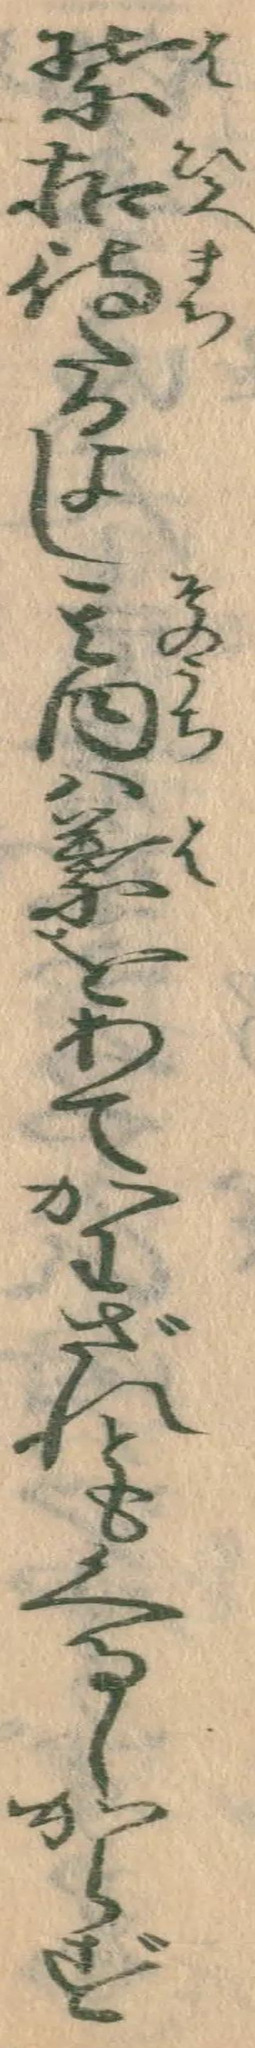葉扣待たるよし其内は葉をあてかわざれともくるしからず
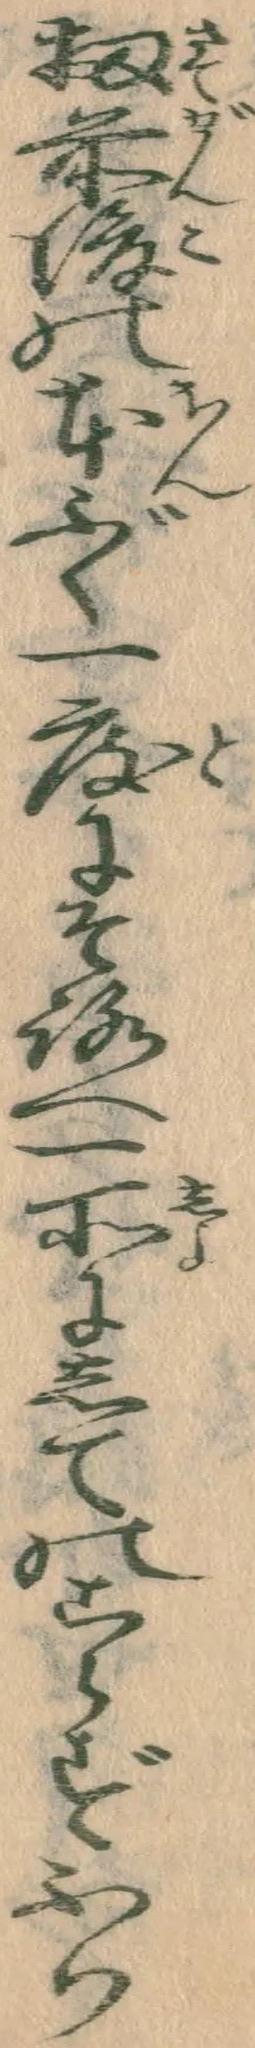扨前後の本ぶく一度にそろへ一所にしてのこらずふり
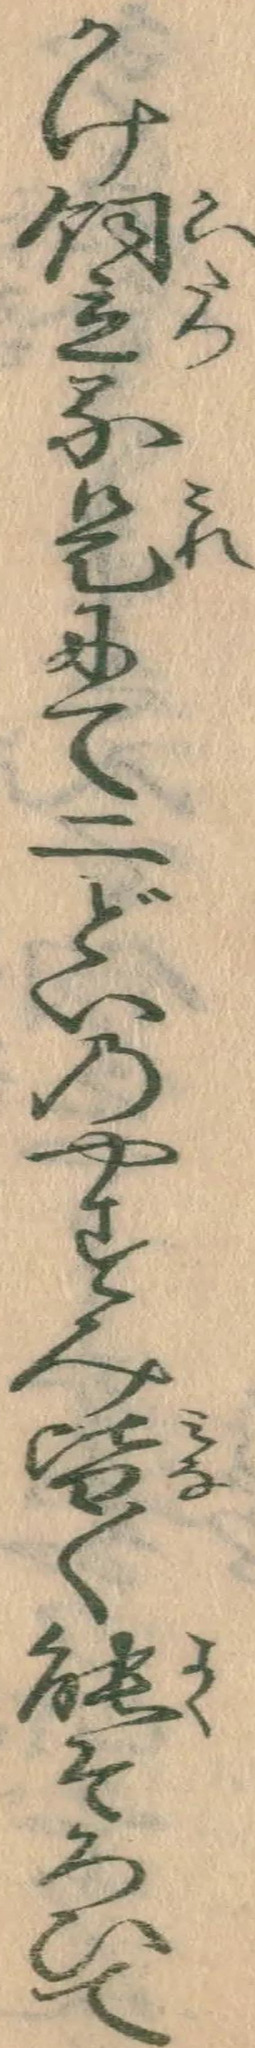かけ飼立る是にて二どいのやすみ皆〳〵能そろひて
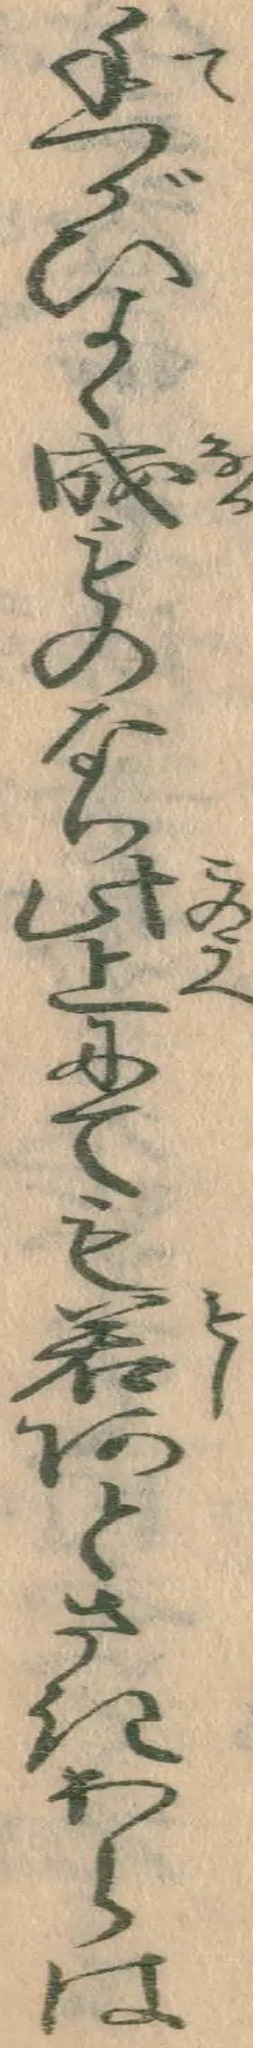手つがひよく成ものなり此上にても若あとさきあらは
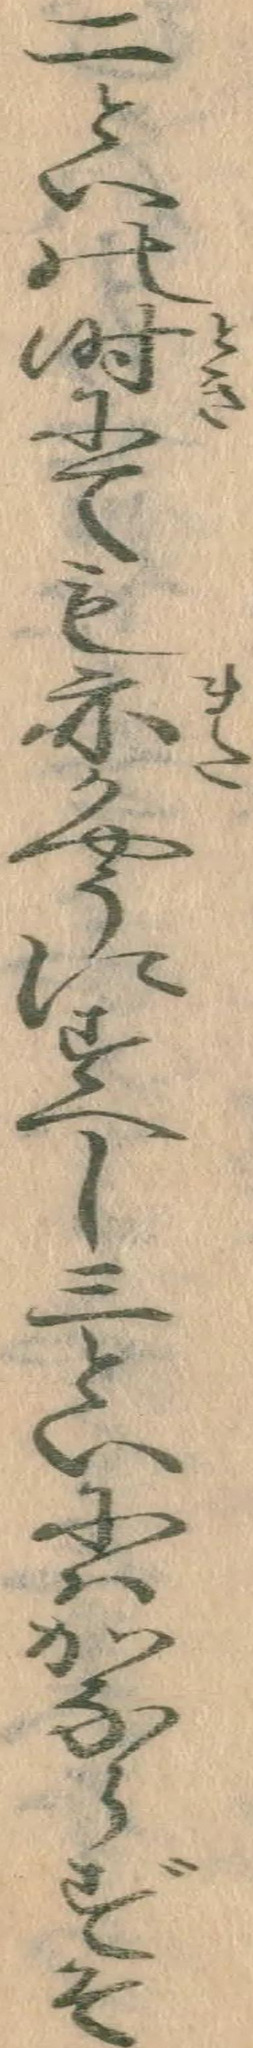二といの時にても亦かやうにすへし三といにはかならずそ
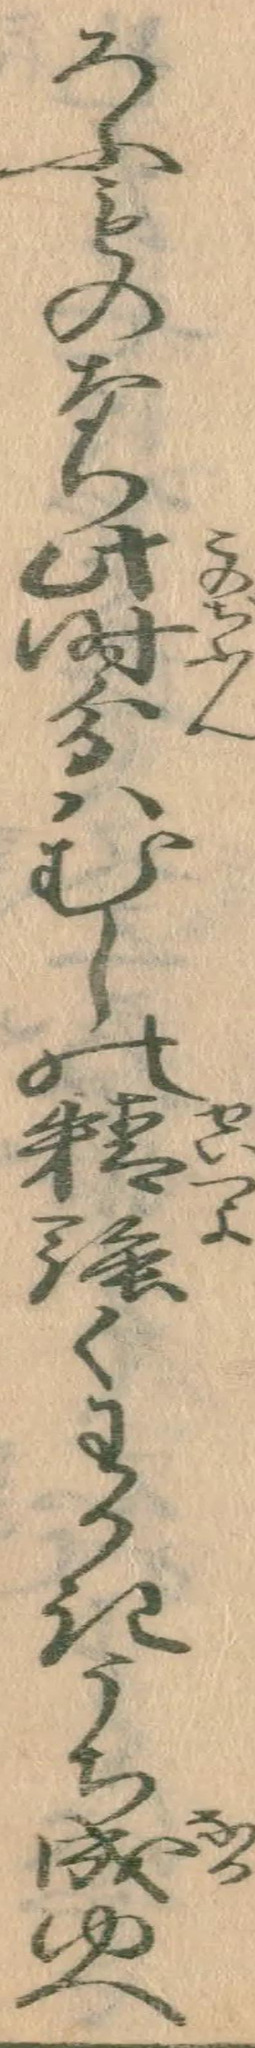ろふものなり此時分はむしの精強くわかきうち成ゆへ
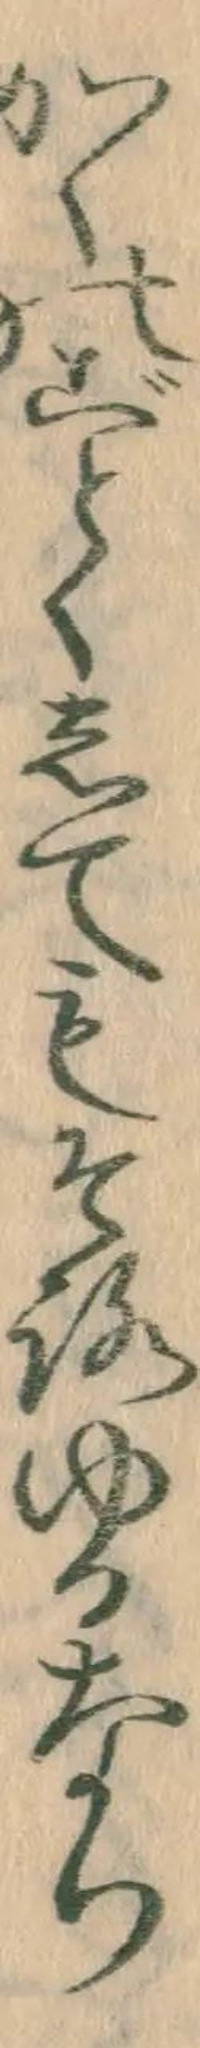かくのごとくしてもそろゆるなり
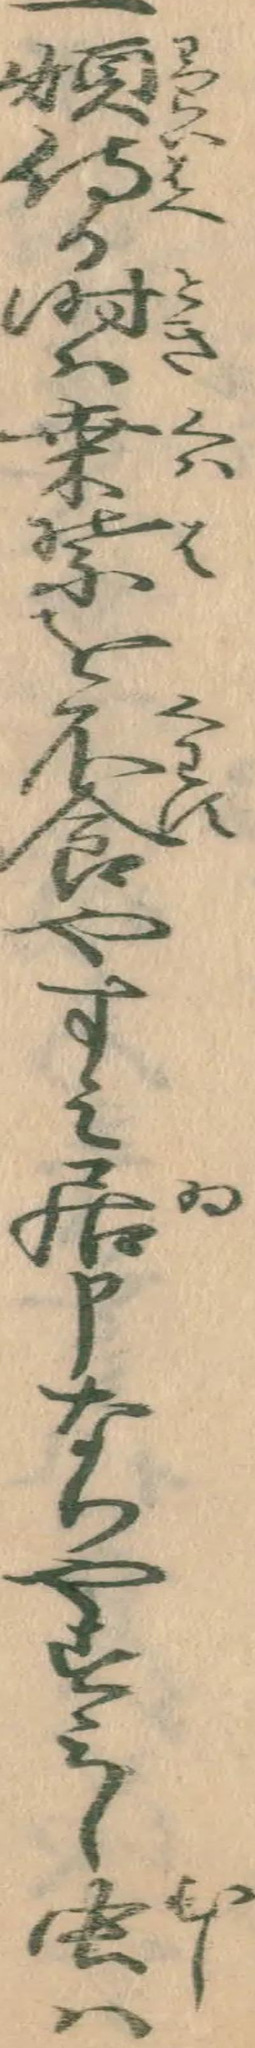一煩侍る時は桑葉を不食やすみ居申なりやすみし虫は
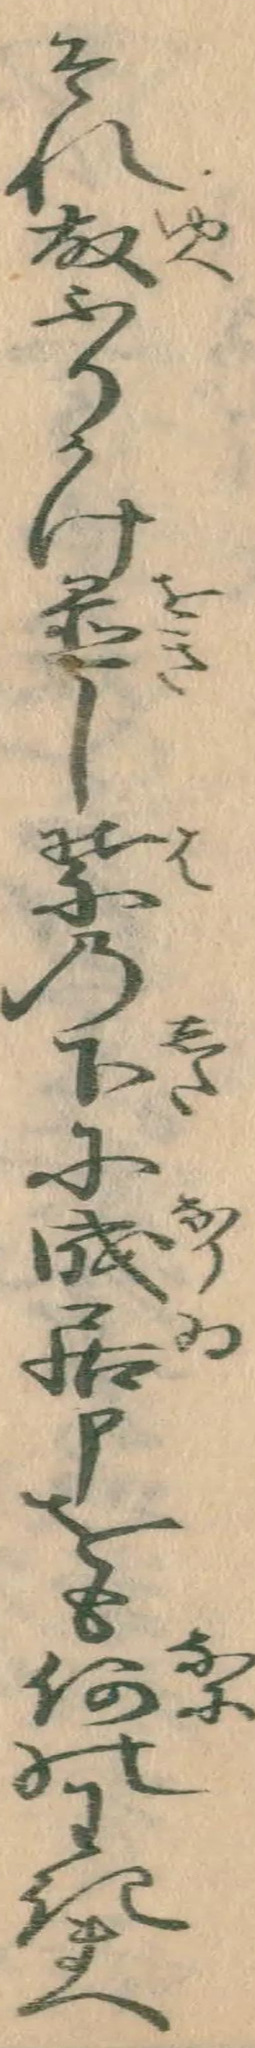それ故ふりかけ置し葉の下に成居申をも何のわきまへ
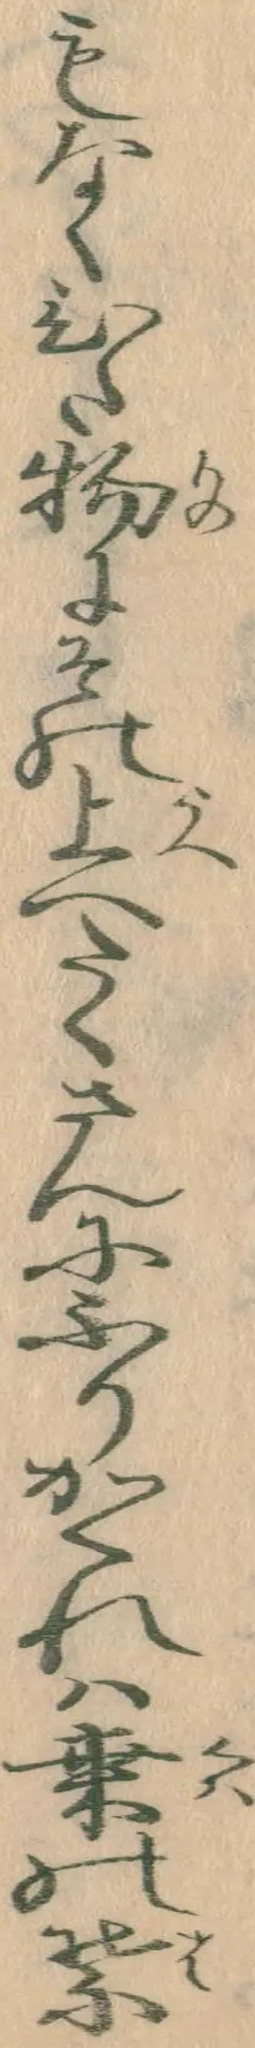もなくひた物にその上へたくさんにふりかくれは桑の葉
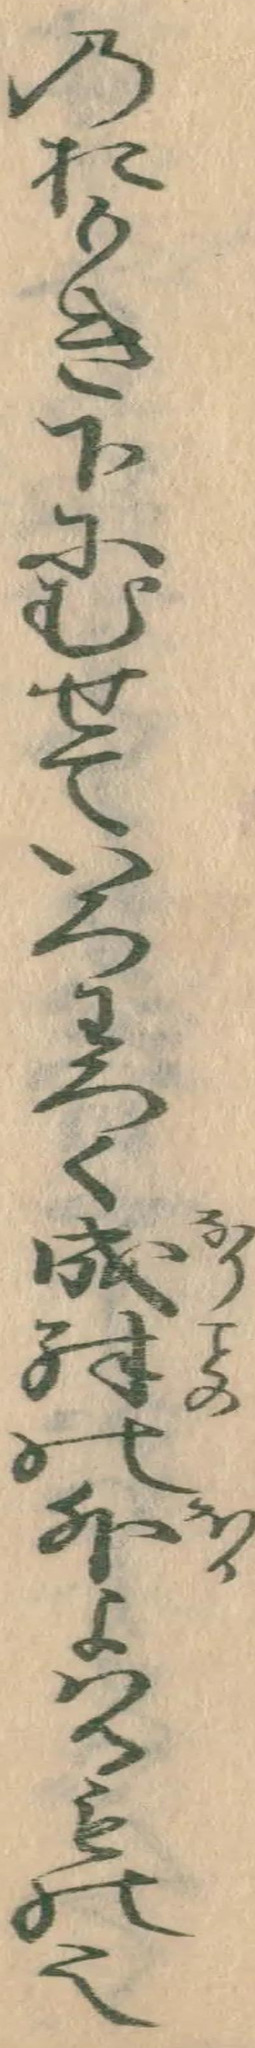のおもき下にむせていろわろく成殊の外よはるもの也
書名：蚕飼養法記
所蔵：国立国会図書館 National Diet Library, JAPAN
